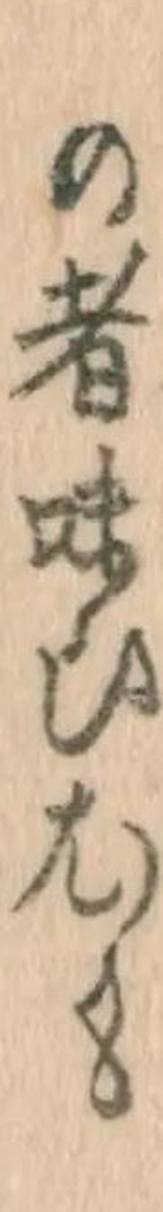の者味ひ尤も
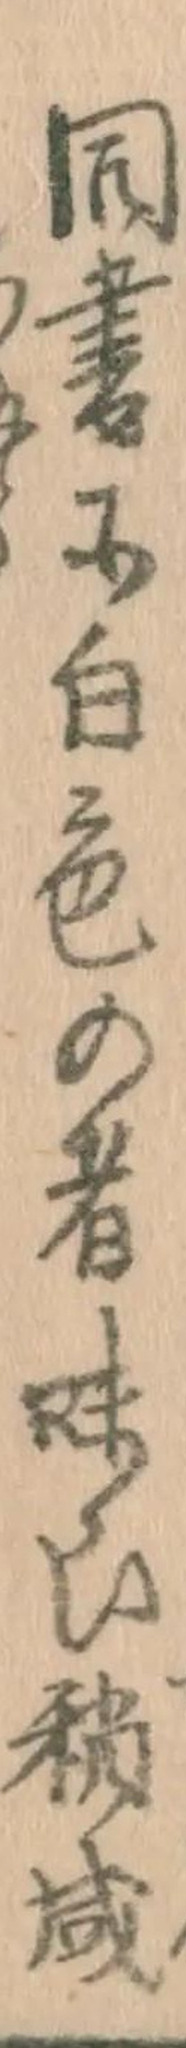同書に白色の者味ひ稍咸
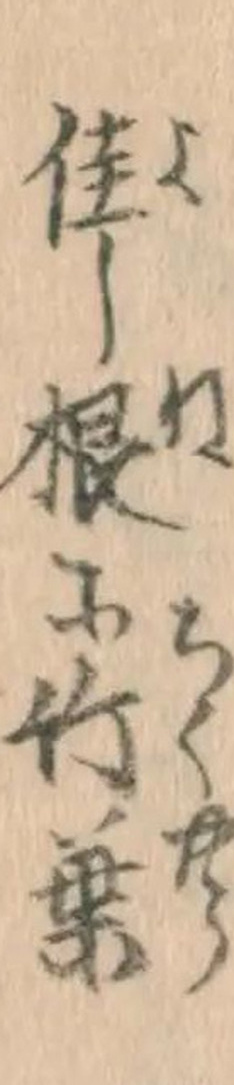佳し根に竹葉
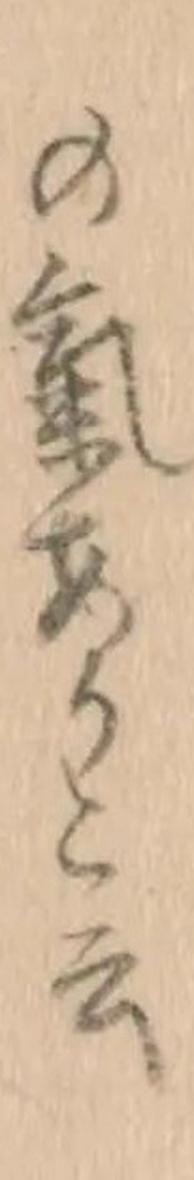の気ありと云
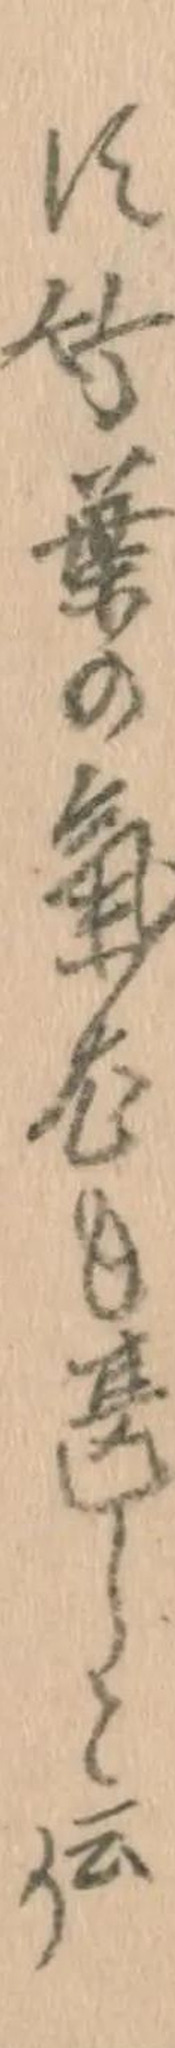す竹葉の気尤も甚しと云り
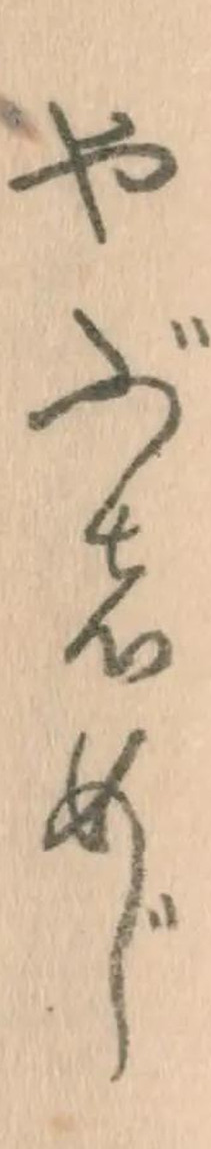やぶしめじ
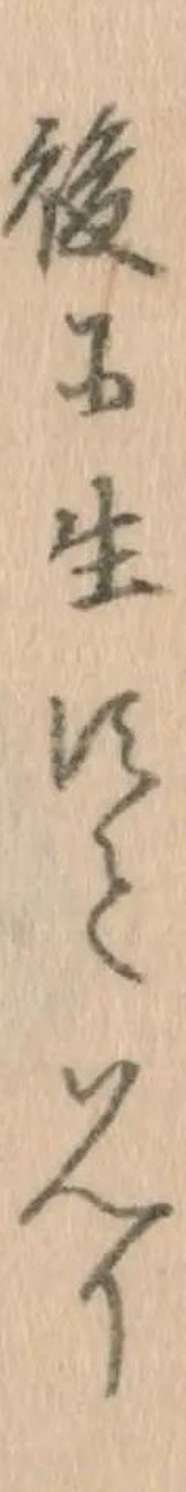後に生すといへり
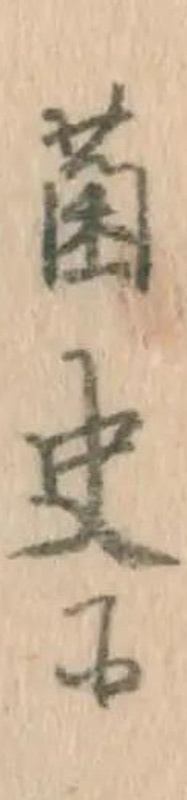菌史に
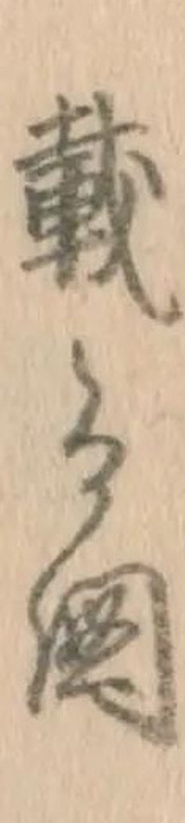載る図

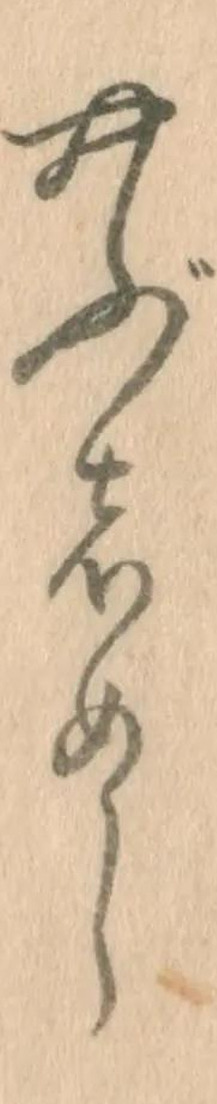やぶしめし
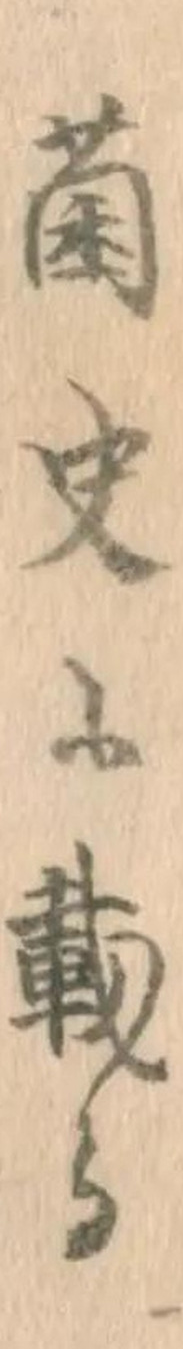菌史に載る
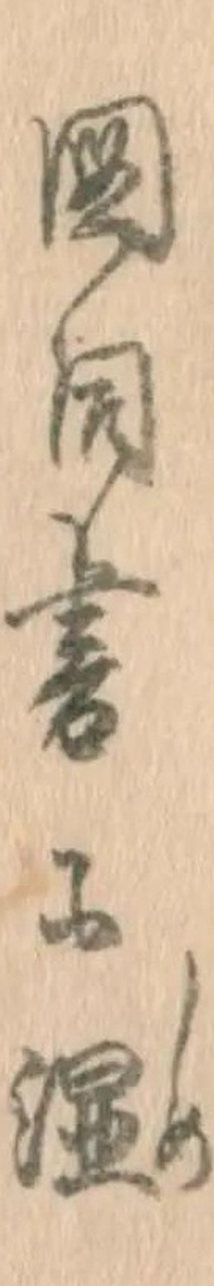図同書に湿
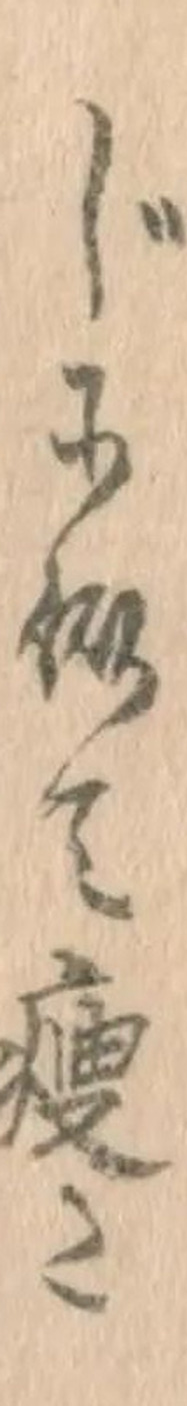じに似て痩た
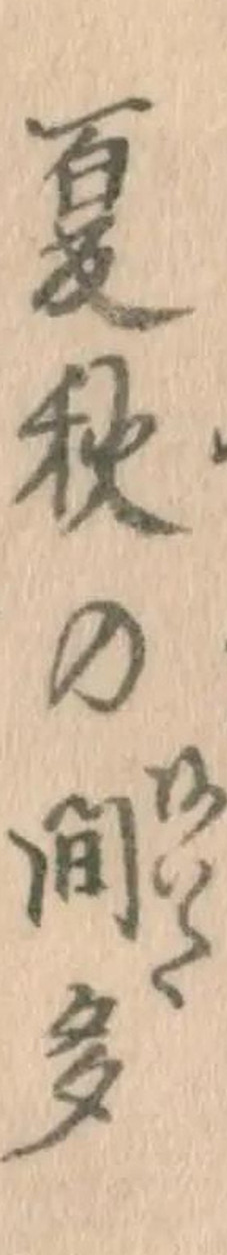夏秋の間多
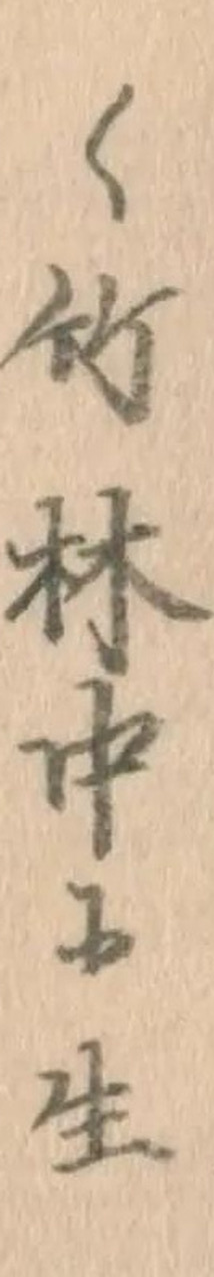く竹林中に生
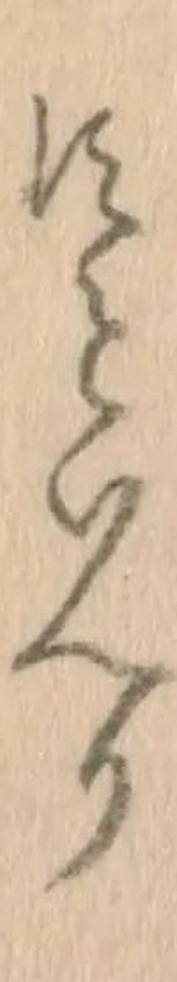すといへり
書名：本草図譜. 巻55-57
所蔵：国立国会図書館 National Diet Library, JAPAN
